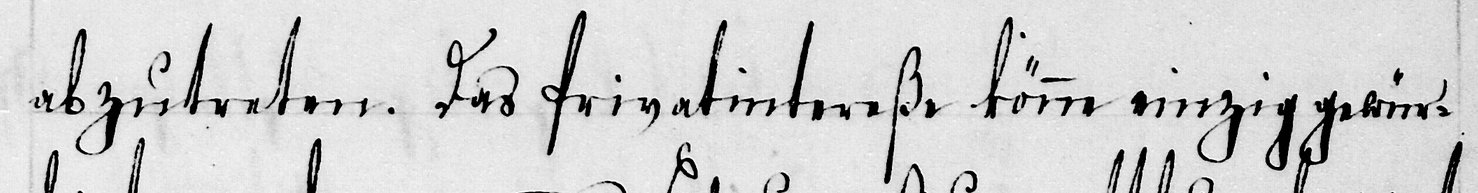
abzutreten. Das Privatintereße könne einzig gewür¬
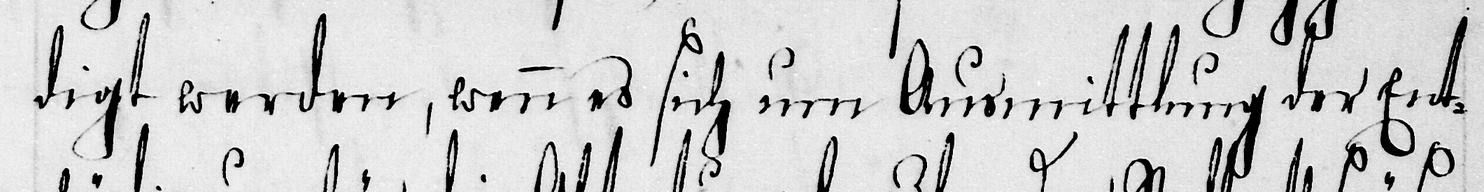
digt werden, wenn es sich um Ausmittlung der Ent¬
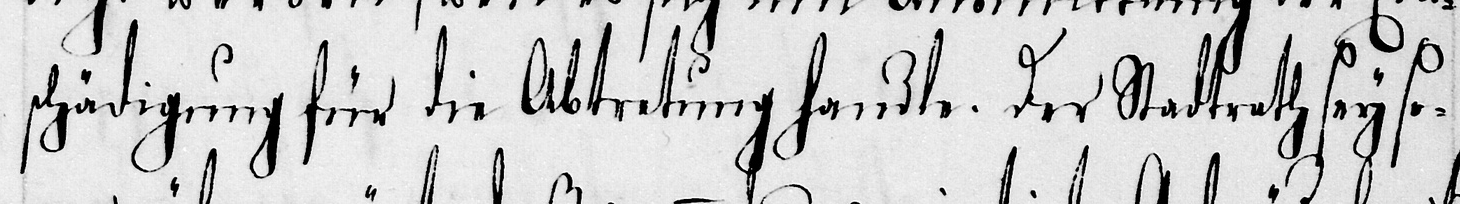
schädigung für die Abtretung handle. Der Stadtrath sey s¬
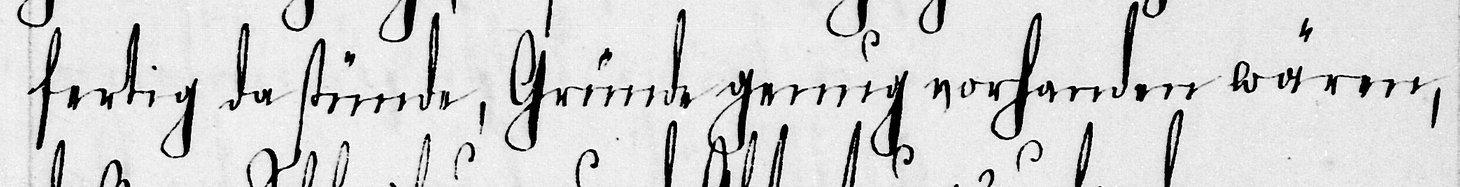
fertig da stünde, Gründe genug vorhanden wären,
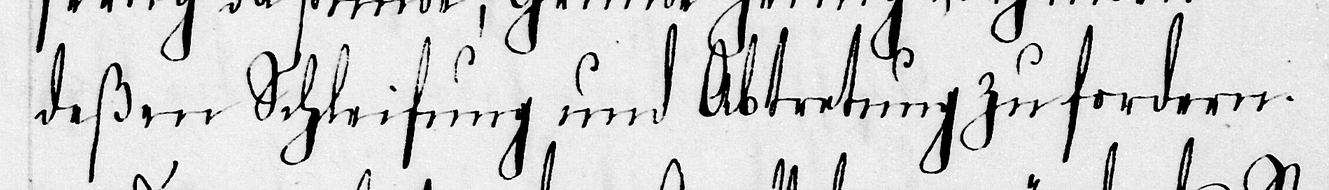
deßen Schleifung und Abtretung zu fordern.
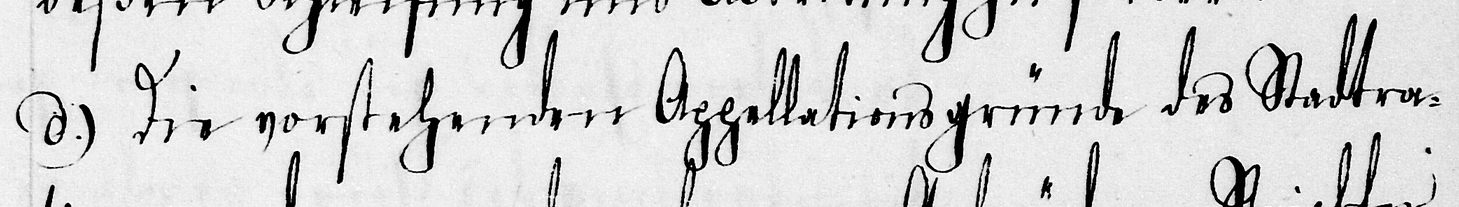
d.) Die vorstehenden Appellationsgründe des Stadtra¬
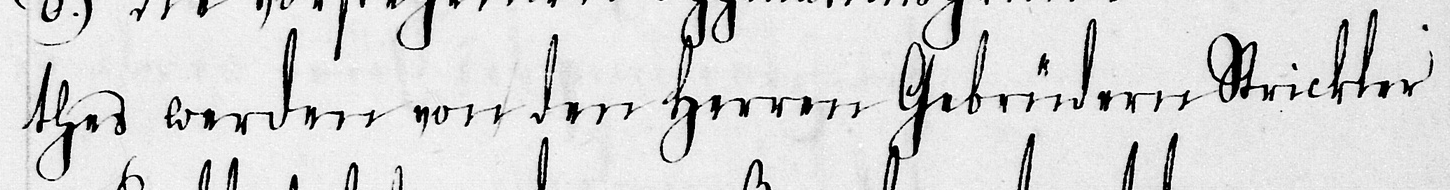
thes werden von den Herren Gebrüdern Strickler
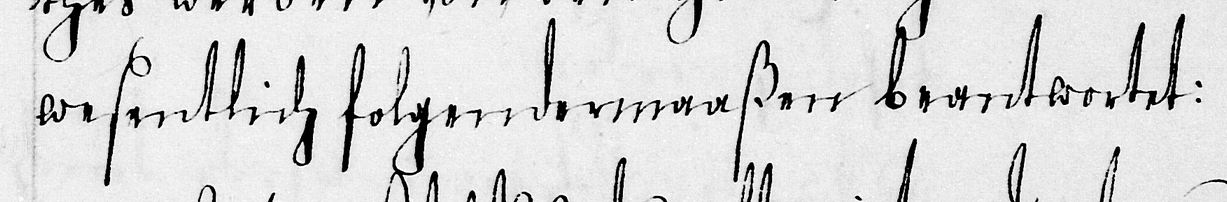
wesentlich folgendermaaßen beantwortet:
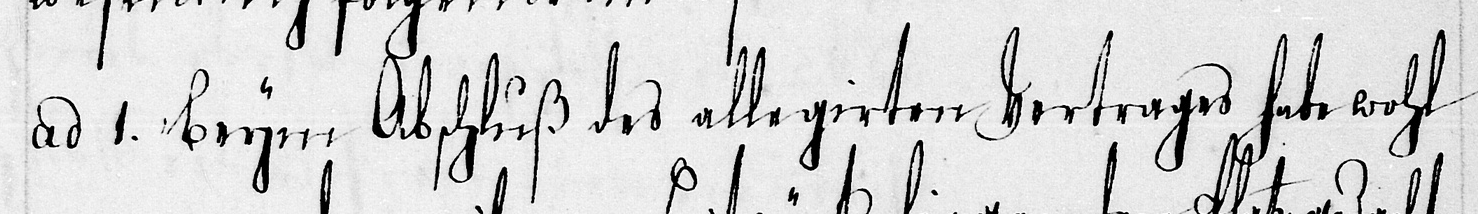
ad 1. Beym Abschluß des allegirten Vertrages habe wohl
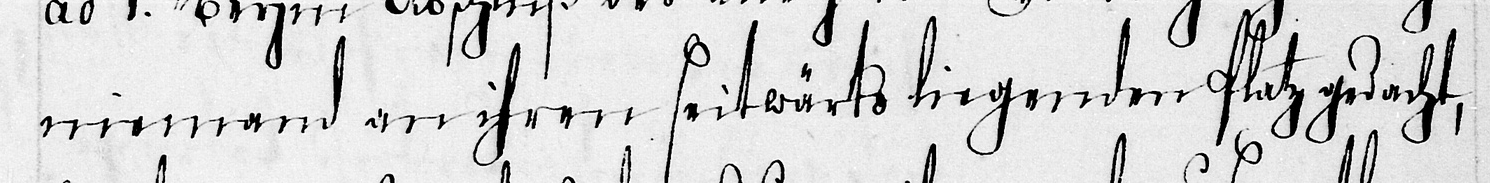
niemand an ihren seitwärts liegenden Platz gedacht,
